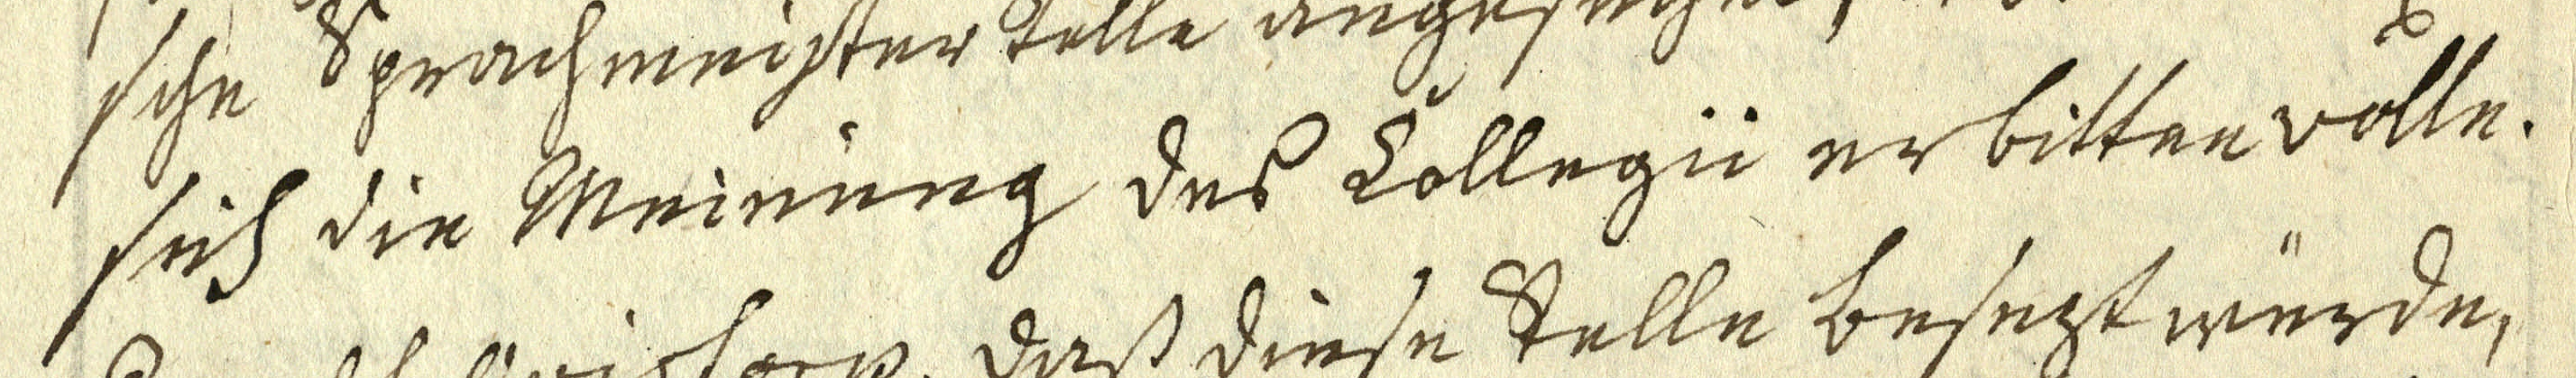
sich die Meinung des Collegii erbitten wolle.
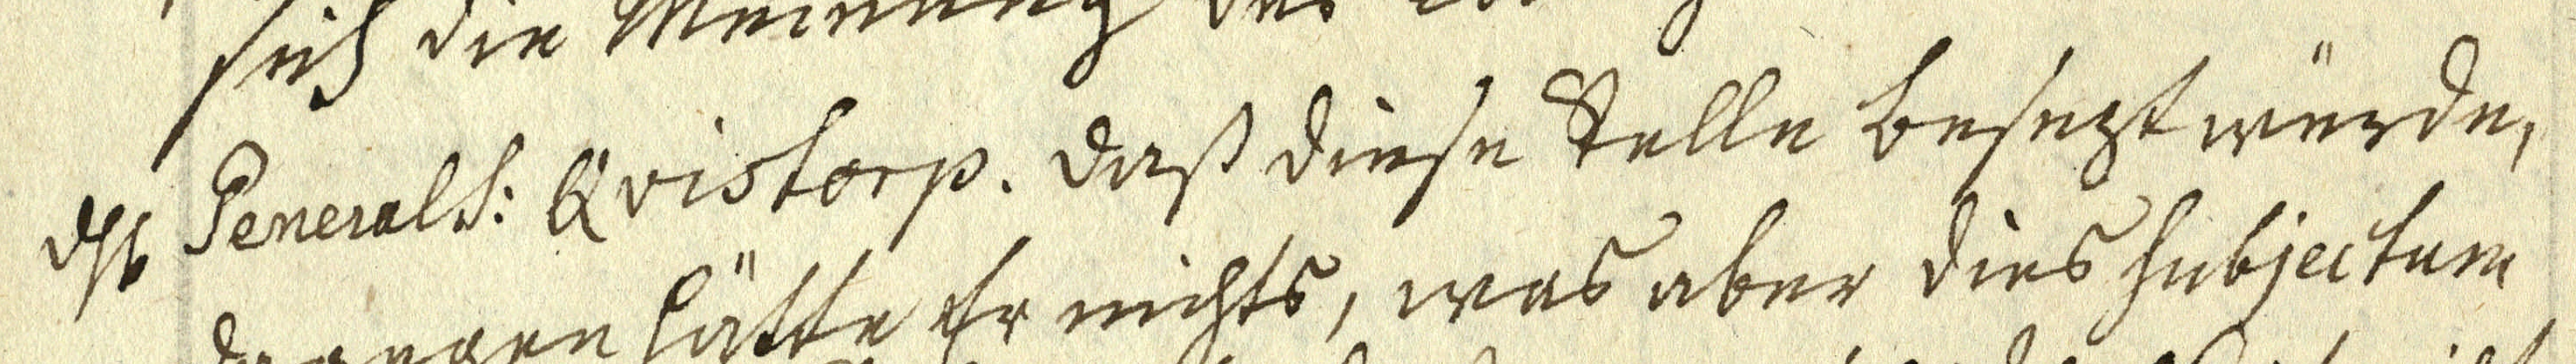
dh GeneralS. Quistorp. Daß diese Stelle besezt würde,
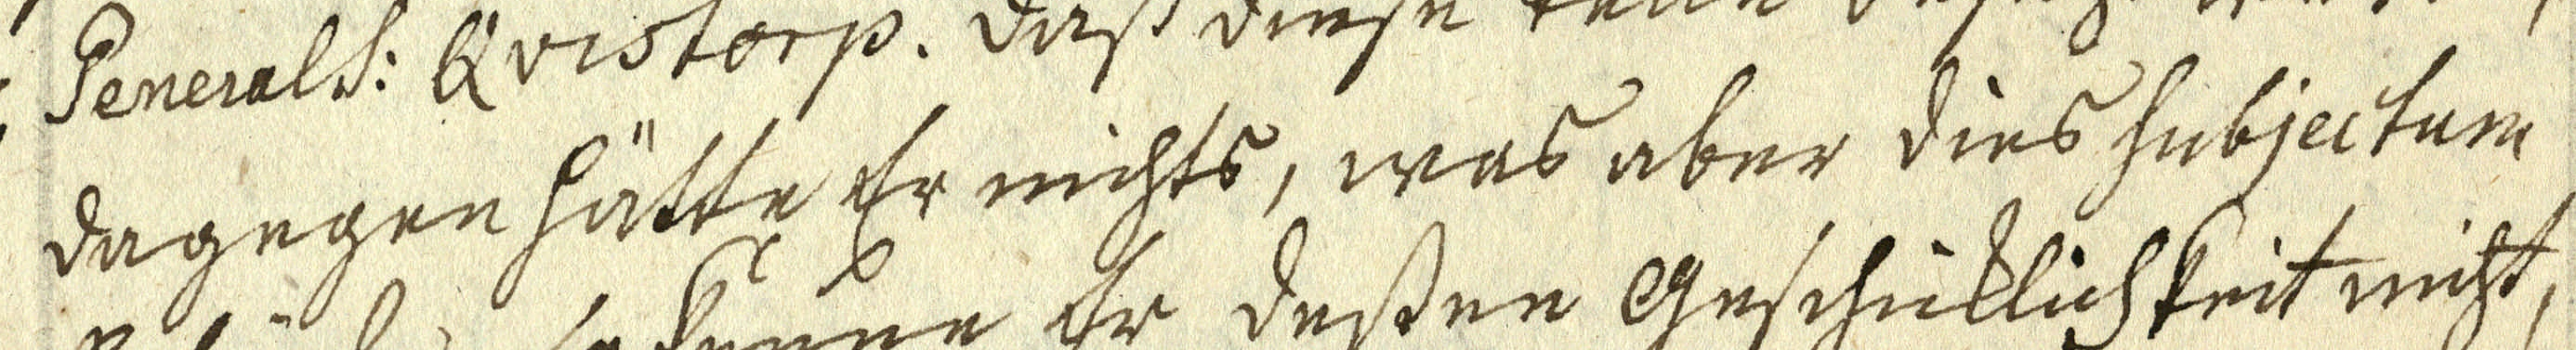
dagegen hätte Er nichts, was aber dies Subjectum
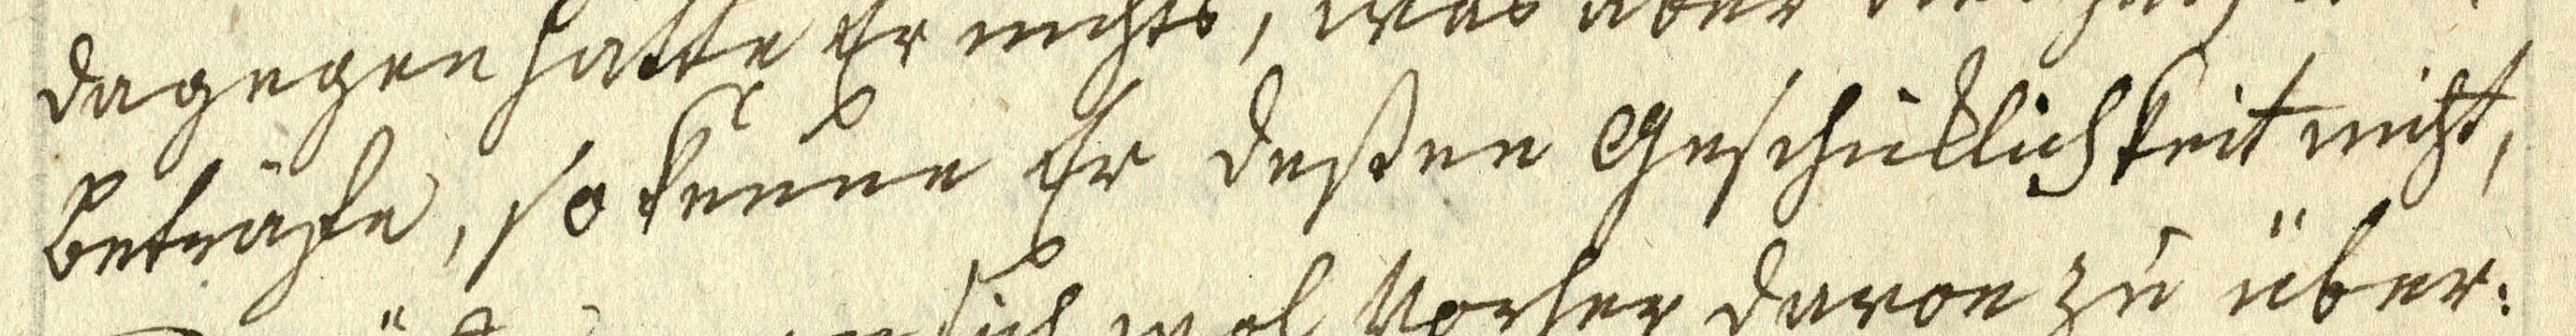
beträfe, so kenne Er deßen Geschicklichkeit nicht,
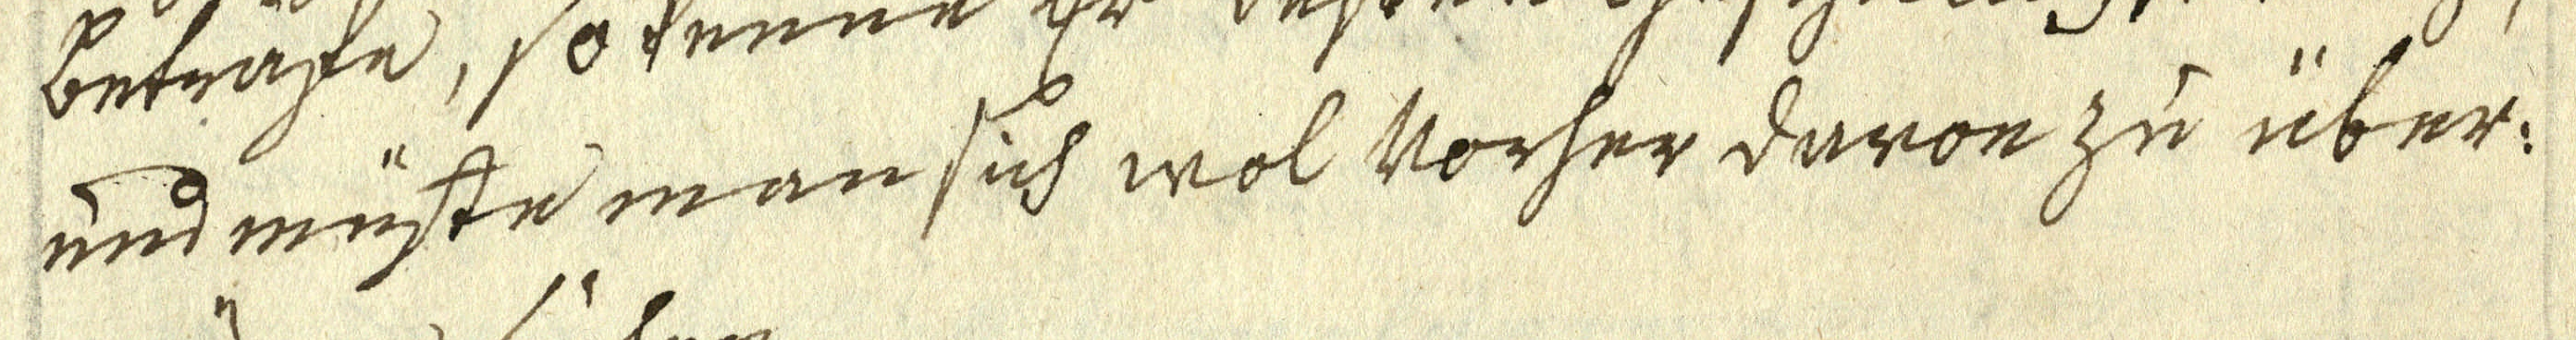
und müste man sich wol vorher davon zu über¬
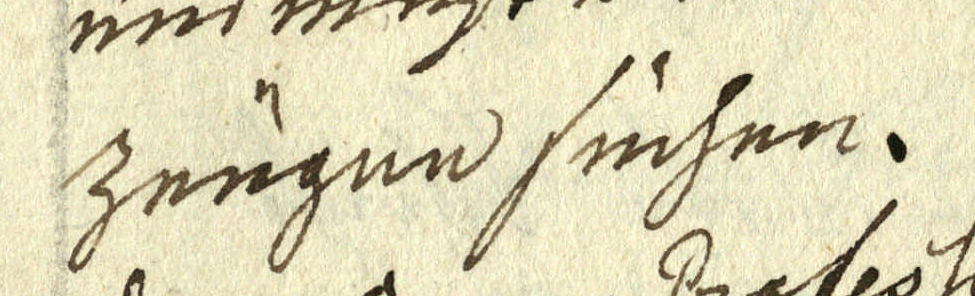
zeugen suchen.
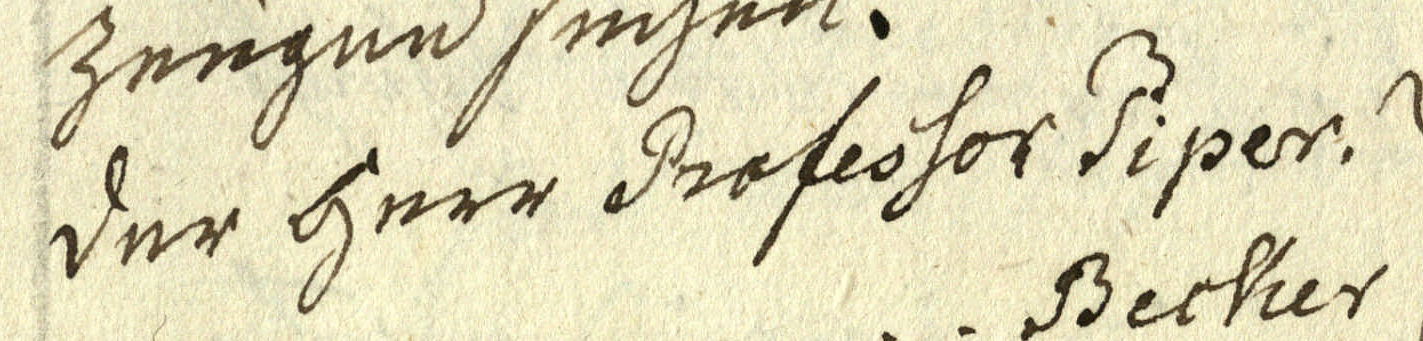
der Herr Professor Piper.
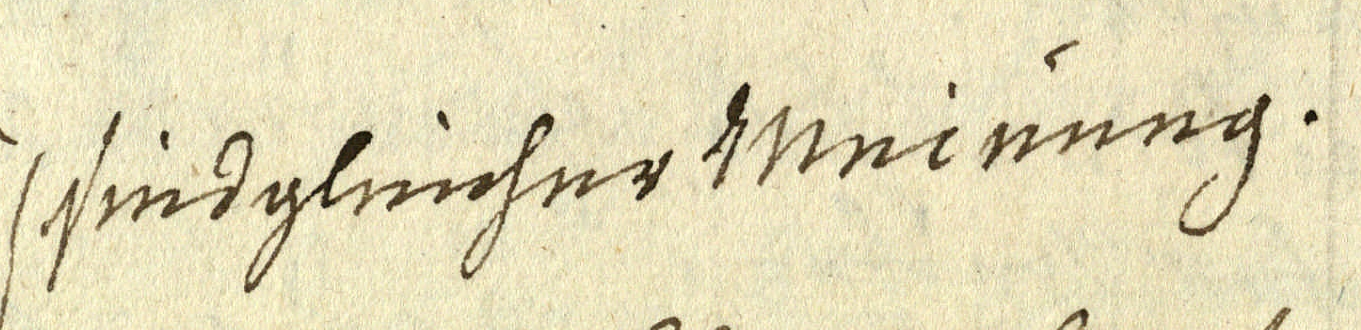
sind gleicher Meinung.
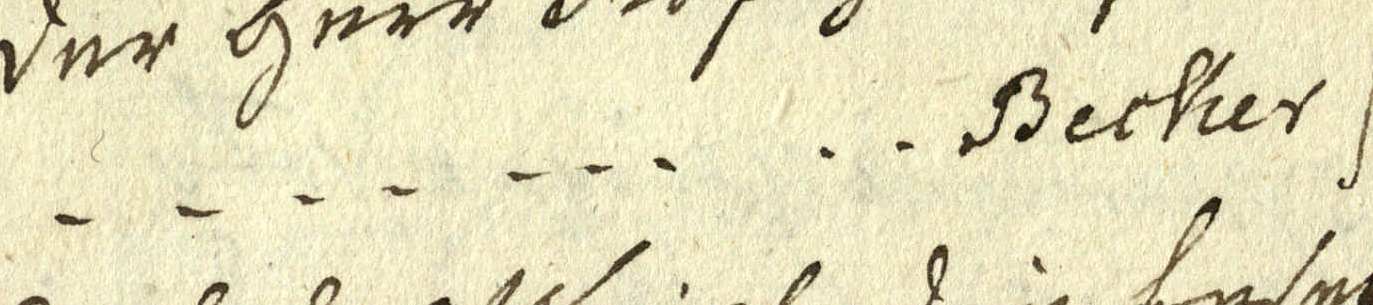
Becker
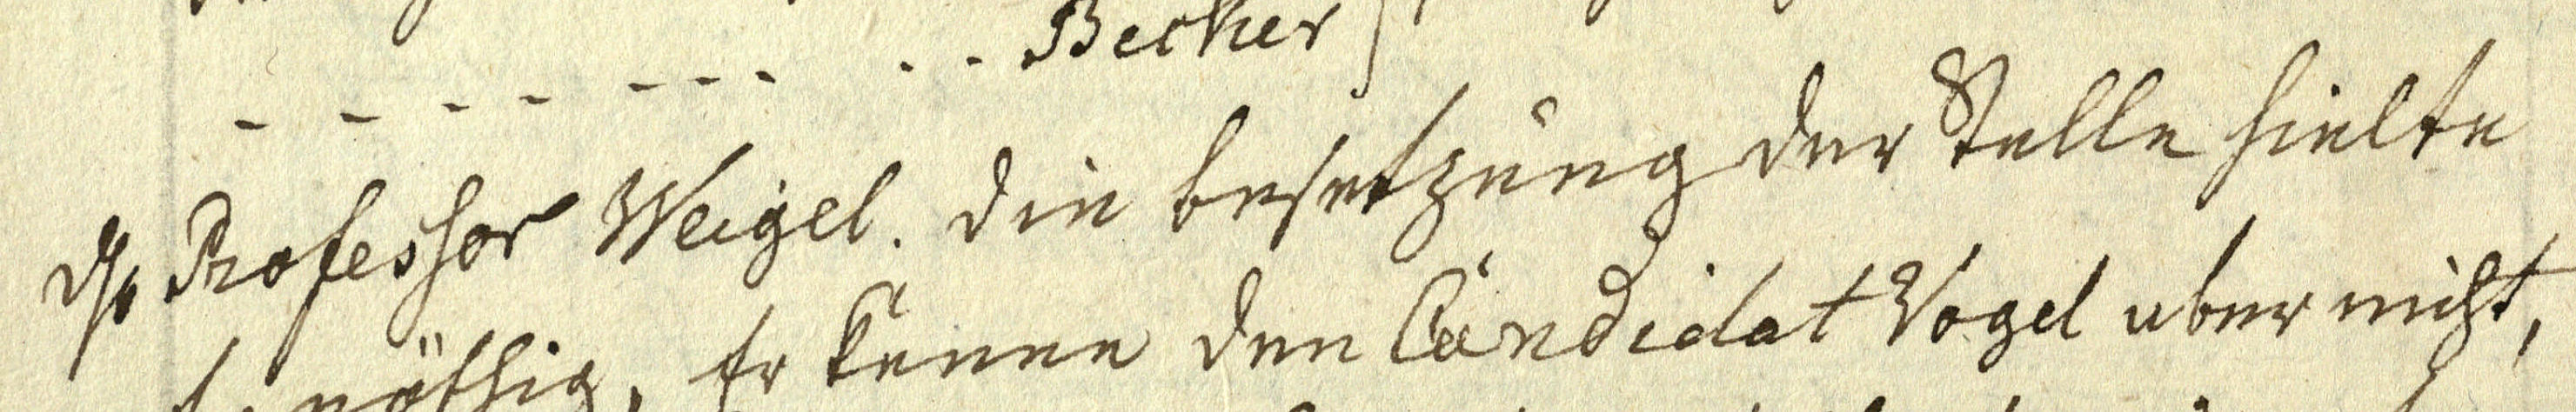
dh Professor Weigel. Die Besetzung der Stelle hielte
